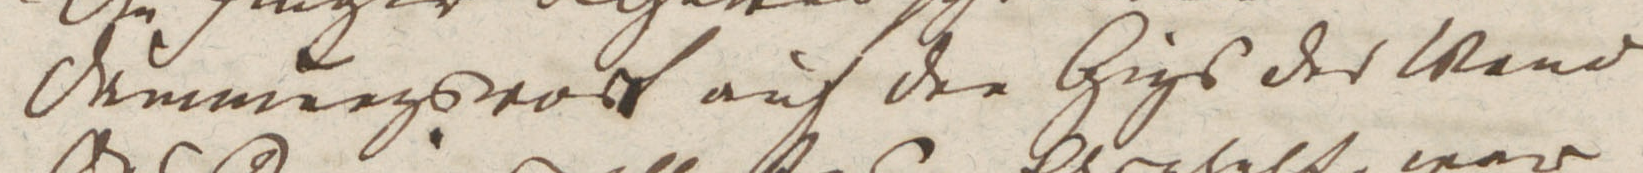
dammungswort auf den Gips der Wand
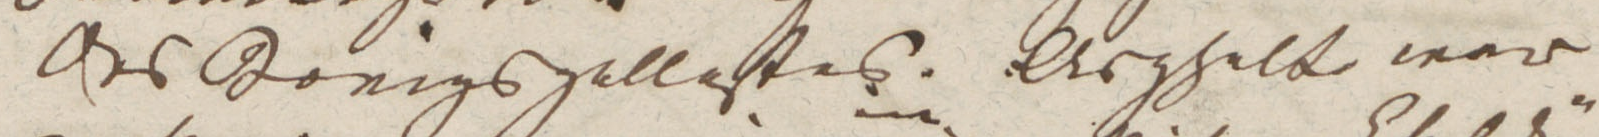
des Konigspallastes. Asphalt war
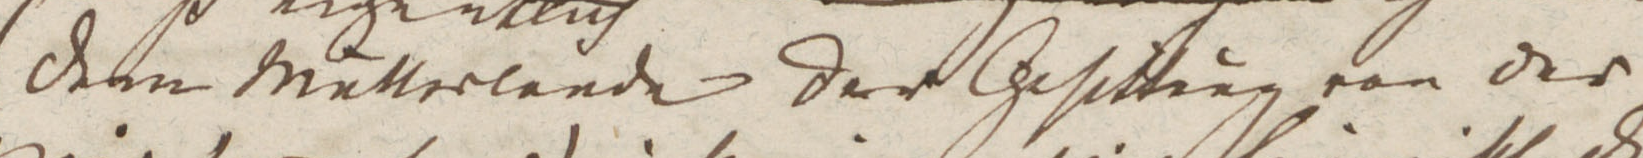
(dem Mutterlande der Gesittung von der
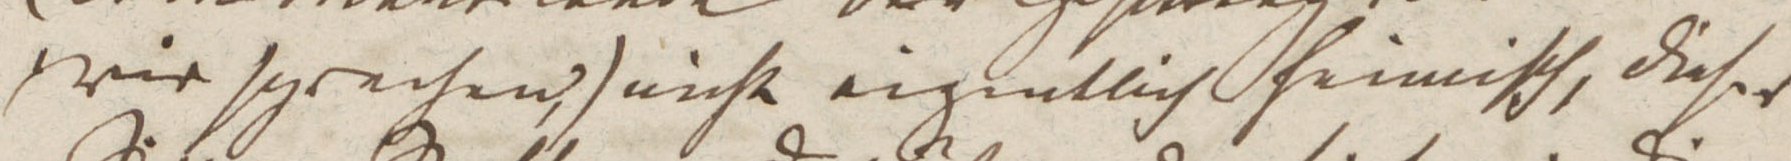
wir sprechen,) nicht eigentlich heimisch, dieser
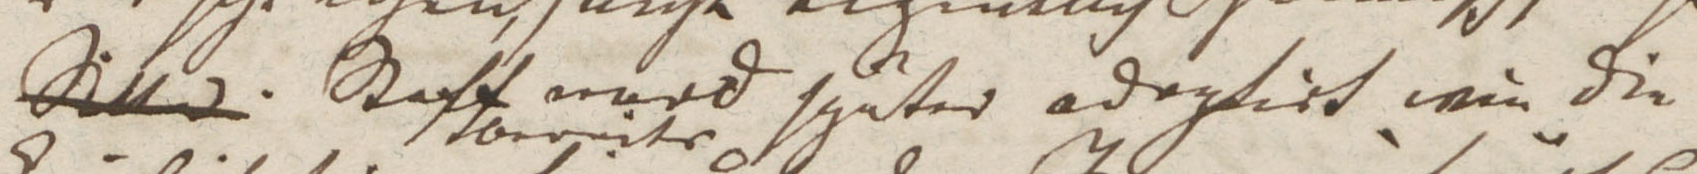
Sitte Stoff ward später adoptirt wie die
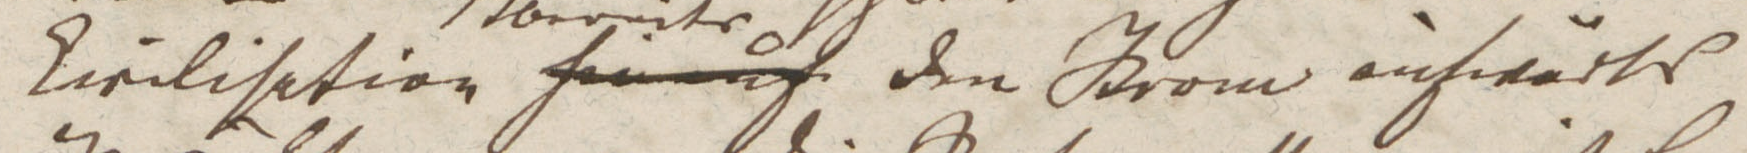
Civilisation hinauf bereits den Strom aufwärts
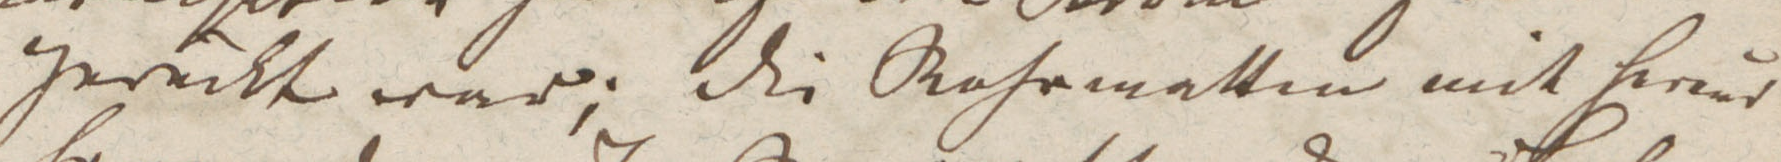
gerückt war; Die Rohrmatten mit heraus
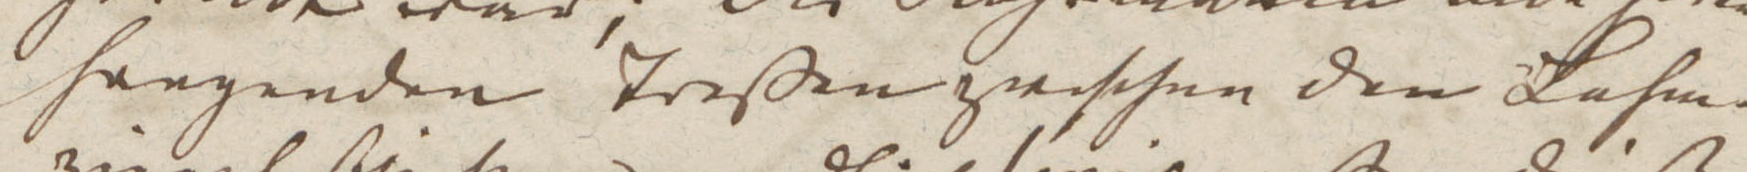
hangenden Tressen zwischen den Lehm-
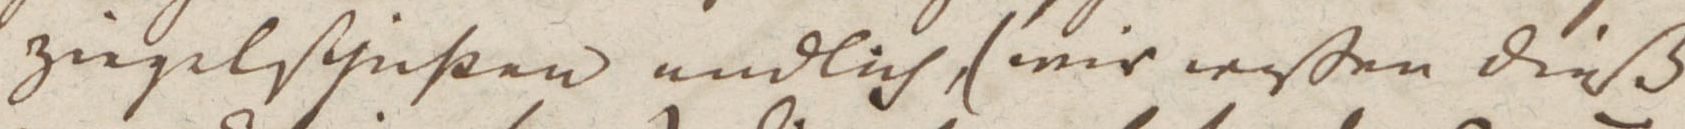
ziegelschichten endlich, (wir wissen diess
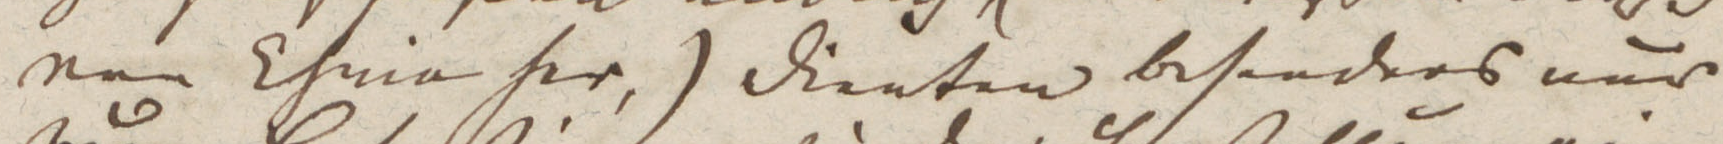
von China her,) dienten besonders nur
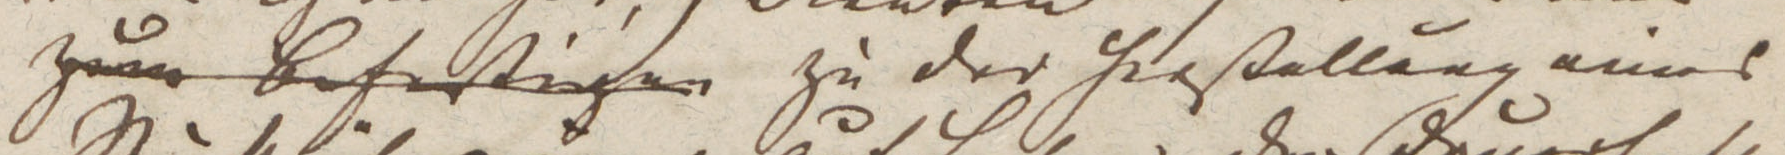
zum befestigen zu der Herstellung eines
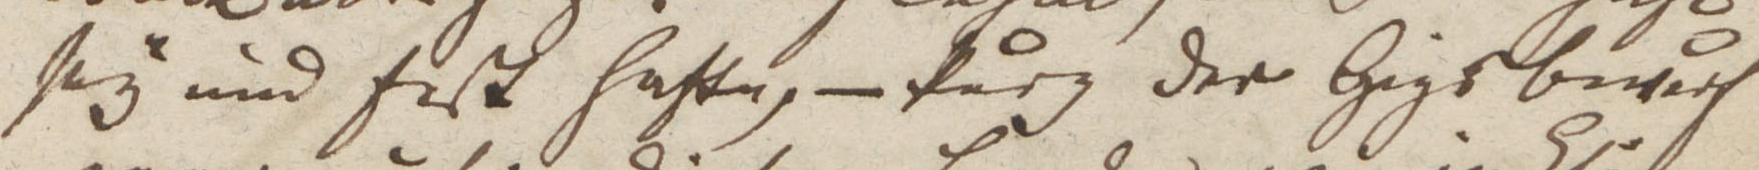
sey und fest hafte, – kurz der Gipsbewurf
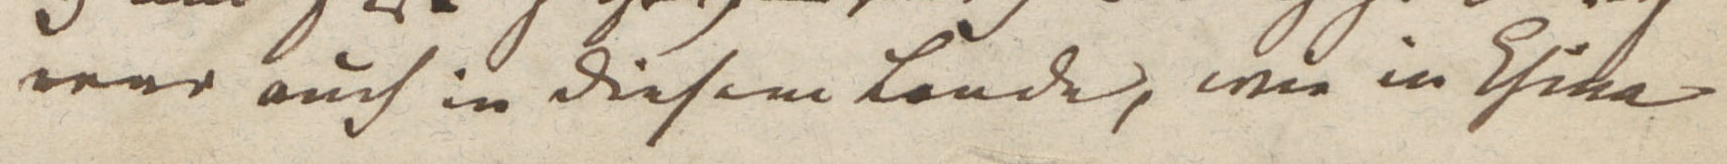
war auch in diesem Lande, wie in China
